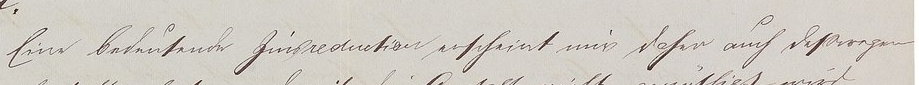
Eine bedeutende Zinsreduktion erscheint mir daher auch deßwegen
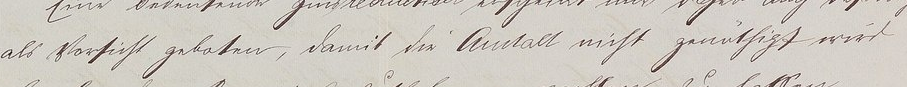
als Vorsicht geboten, damit die Anstalt nicht genöthigt wird
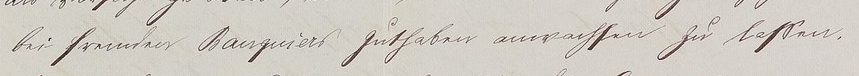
bei fremden Banquiers Guthaben anwachsen zu laßen.
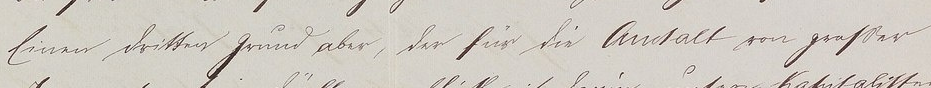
Einen dritten Grund aber, der für die Anstalt von großer
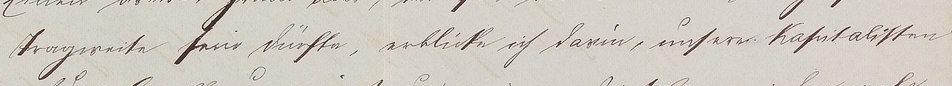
Tragweite sein dürfte, erblicke ich darin, unsere Kapitalisten
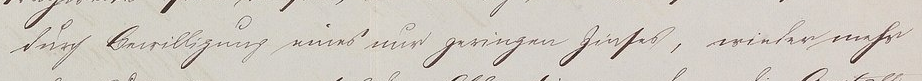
durch Bewilligung eines nur geringen Zinses, wieder mehr
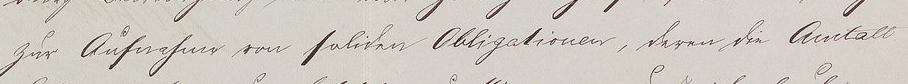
zur Aufnahme von soliden Obligationen, deren die Anstalt
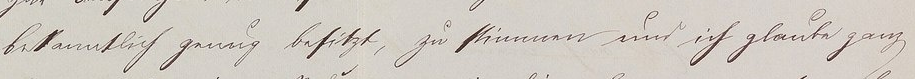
bekanntlich genug besitzt, zu stimmen und ich glaube ganz
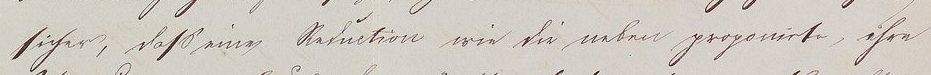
sicher, daß eine Reduction wie die neben proponirte, ihre
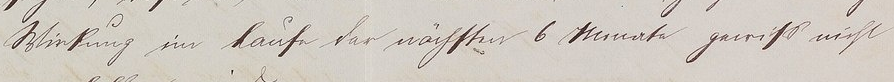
Wirkung im Laufe der nächsten 6 Monate gewiß nicht
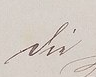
wird.
